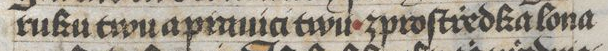ruku twu a pravici twu.zproſtṙedka lona
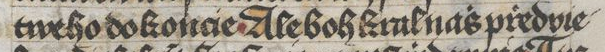tweho dokoncie.Ale boh kral naṡ pṙedvie¬
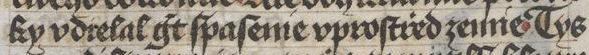ky vdielal ḡt ſpaſenie vproſtṙed zemie.Ty
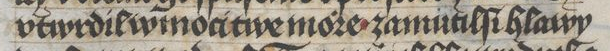vtwrdil wmoci twe moṙe.zamutilſi hlawy
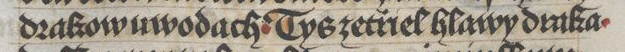drakow uwodach.Tys zetṙiel hlawy draka.
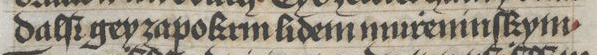dalſi gey zapokrm lidem muṙeninſkym.
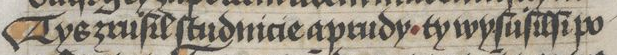Tys zruẛil ſtudnicie a prudy.ty wyſuẛilſi po¬
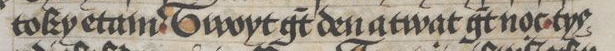toky etam.Twoyt ḡt den a twat ḡt noc.tys
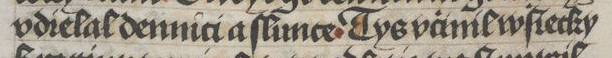vdielal dennici a ſlunce.Tys vċinil wẛiecky
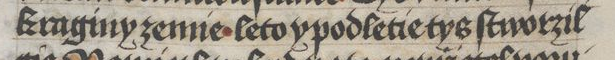kraginy zemie.leto y podletie tys ſtworzil
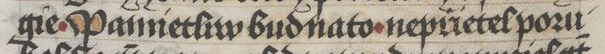gie.Pamietliv bud nato.nepṙietel poru¬
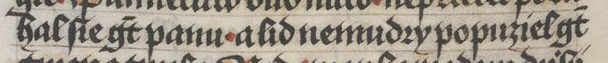hal ſie ḡt panu.a lid nemudry popuziel ḡt
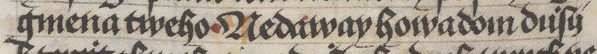gmena tweho.Nedaway howadom duẛij
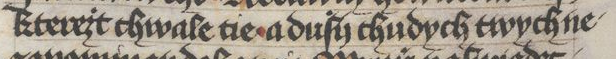ktereżt chwale tie.a duẛij chudych twych ne¬
